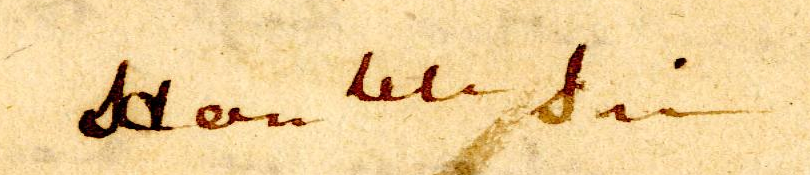Hon^ble Sir
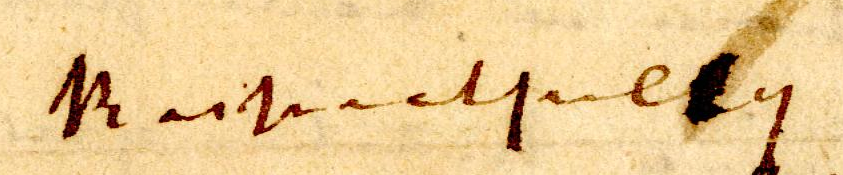Respectfully
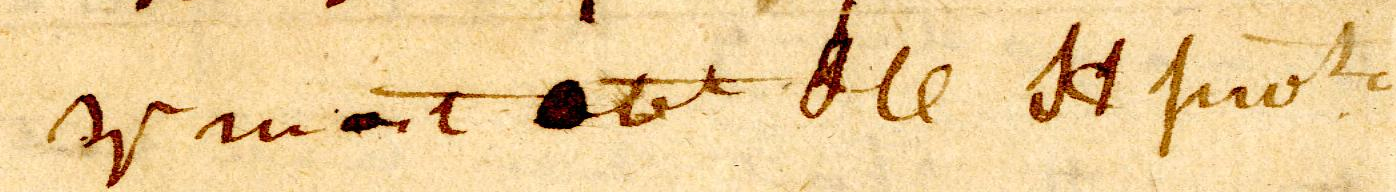y^r most ob^t &le H serv^t
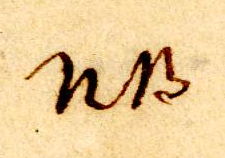NB
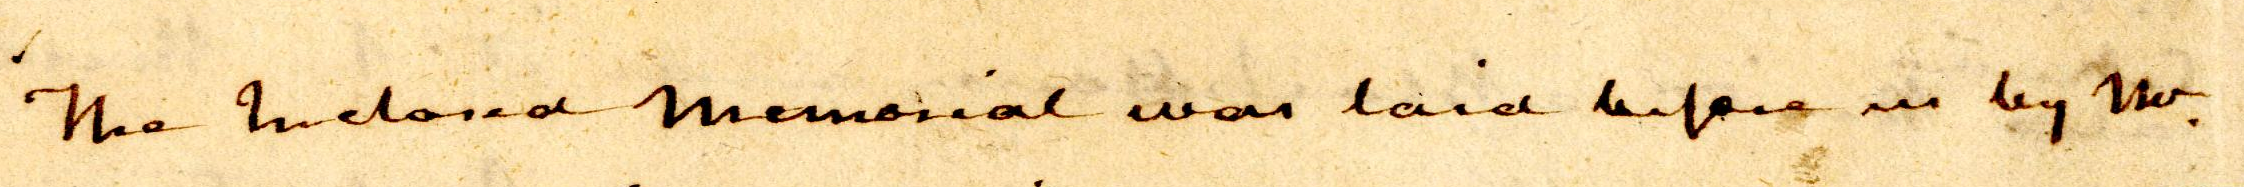The Inclosed Memorial was laid before us by M^r.
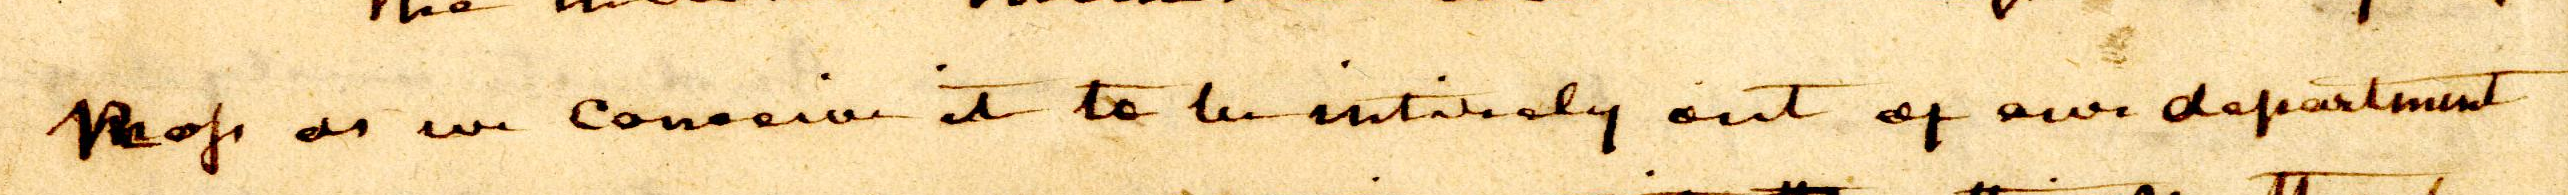Ross as we Conceive it to be intiraly out of our department
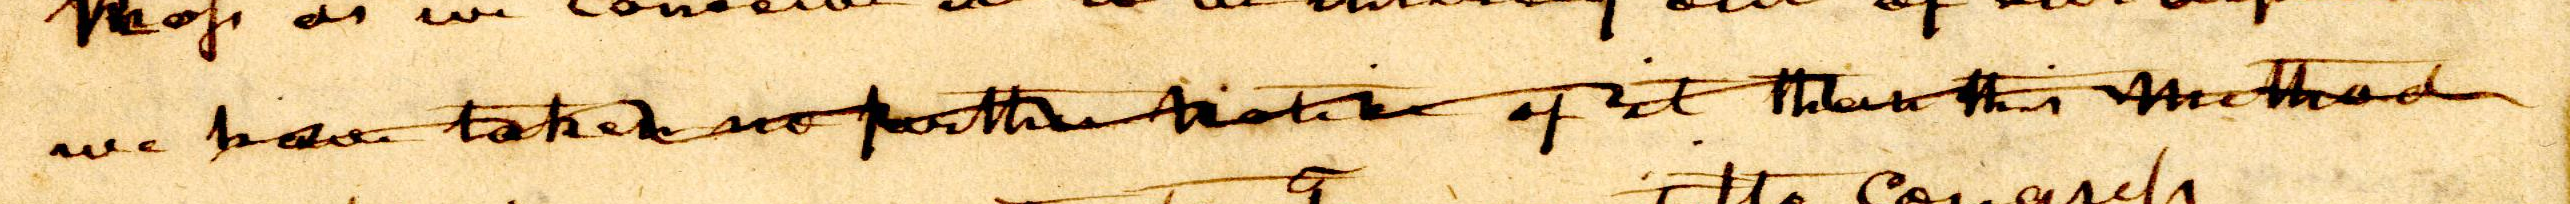we have taken no particular notice of it then this method
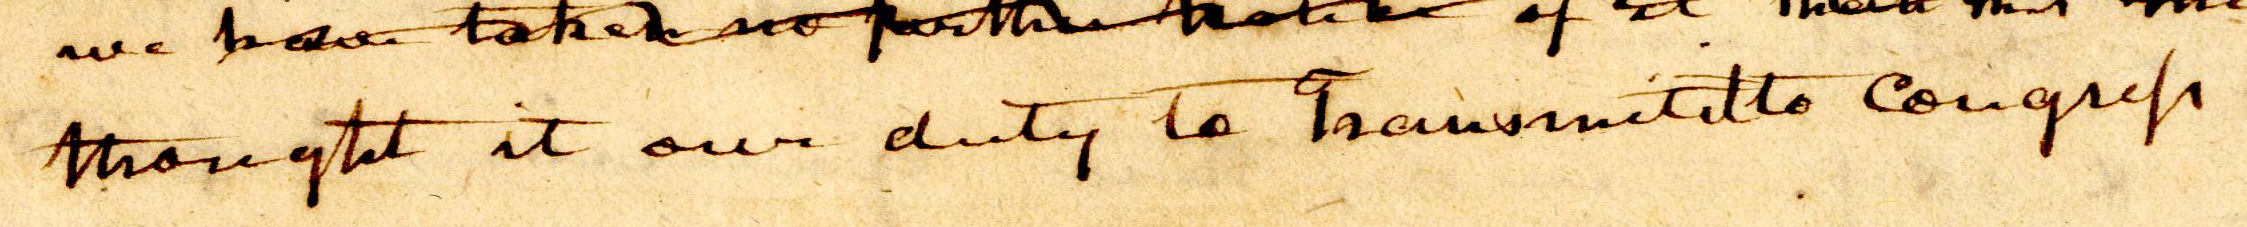thought it our duty to Transmit it to Congress
